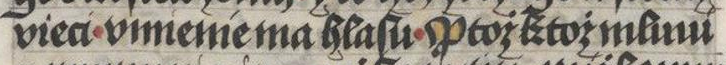viecí.vmieníe ma hlaſu. Ꝓtoż ktoż mluuí
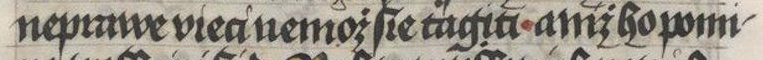neprawe vieci nemoż ſie tagiti.aníż ho pomi¬
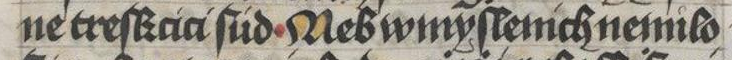ne treſkcící ſúd.Neb wmyẛleních nemilo¬
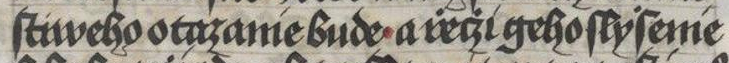ſtiweho otazaníe bude.a ṙecżí geho ſlyẛeníe
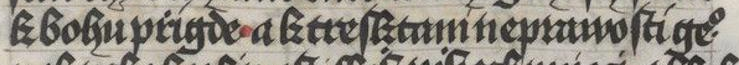kbohu pṙígde.a ktreſktaní neprawoſtí geo
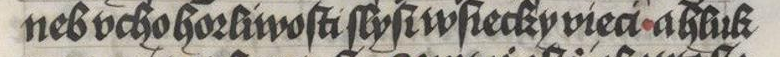neb vcho horliwoſti ſlyẛí wẛiecky víecí.a hluk
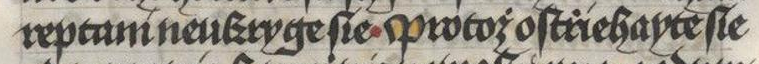reptaní neukryge ſíe.Protoż oſtṙíehayte ſíe
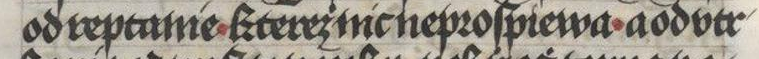od reptaníe.ktereż níc neproſpíewa.a odvtr¬
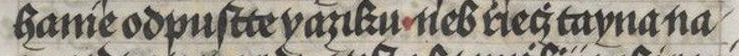haníe odpuſtte yaziku.neb ṙiecż tayna na¬
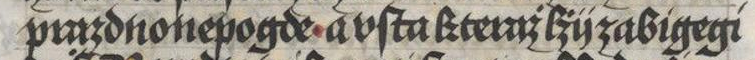prazdno nepgde.a vſta kteraż lżij zabígegí.
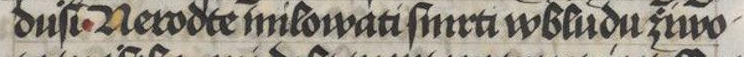duẛi.Nerodte milowati ſmrti wbludu żiwo¬
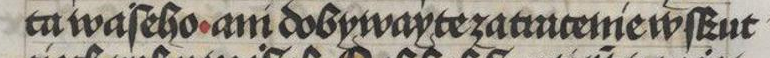ta waẛeho.aní dobywayte zatraceníe wſkut¬
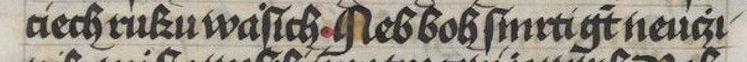cíech ruku waẛich.Neb boh ſmrti ḡt neucżi¬
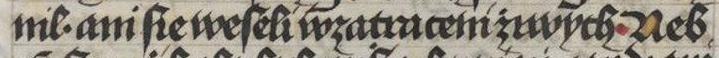nil.ani ſie weſelí wzatracení żiwych.Neb
